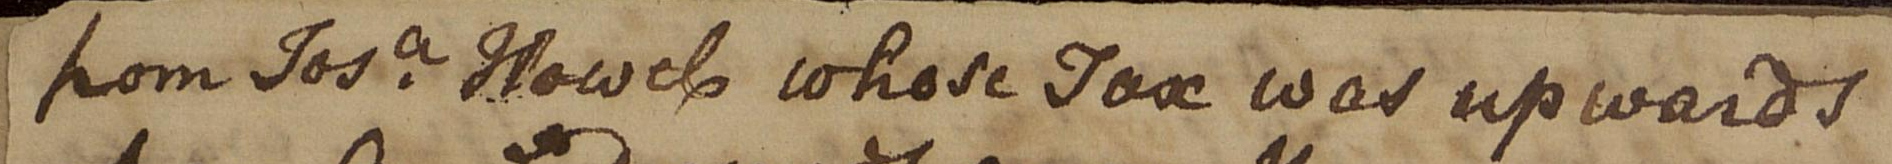from Jos^a. Howels whose Tax was upwards
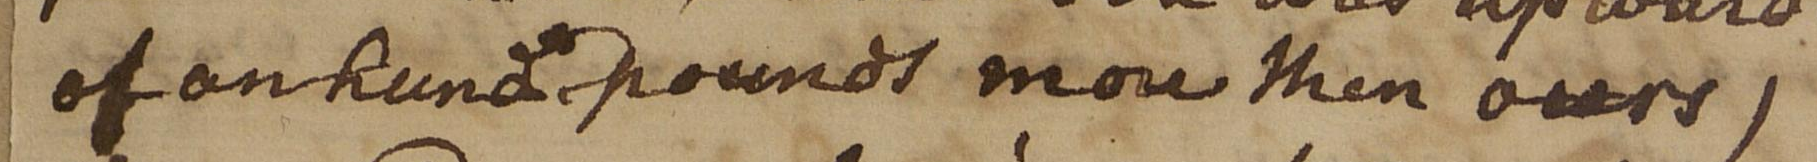of an hund pounds more then ours)
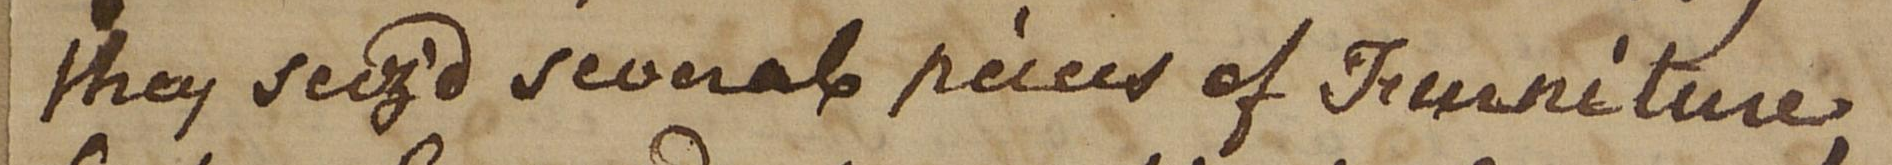they seiz'd several peices of Furniture,
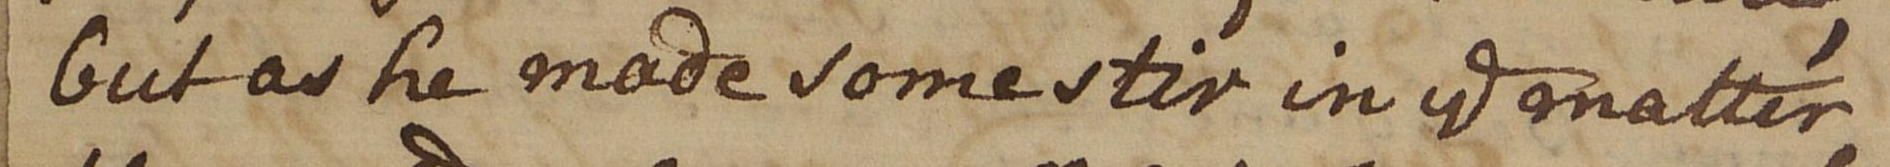but as he made some stir in y^e matter
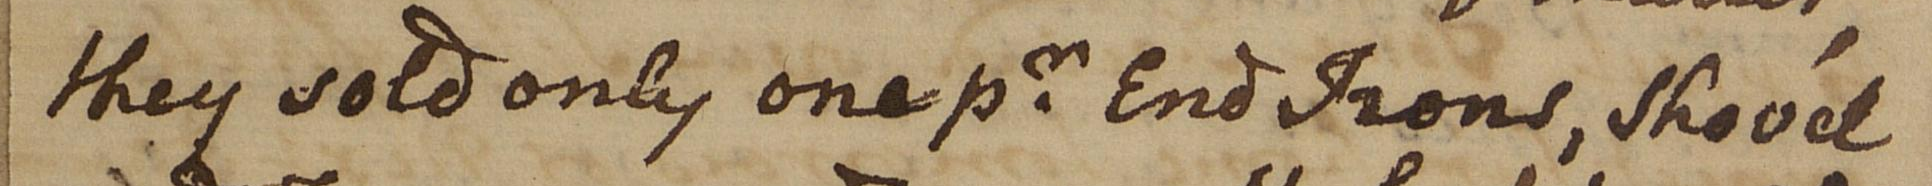they sold only one p^r. End Irons, Shovel
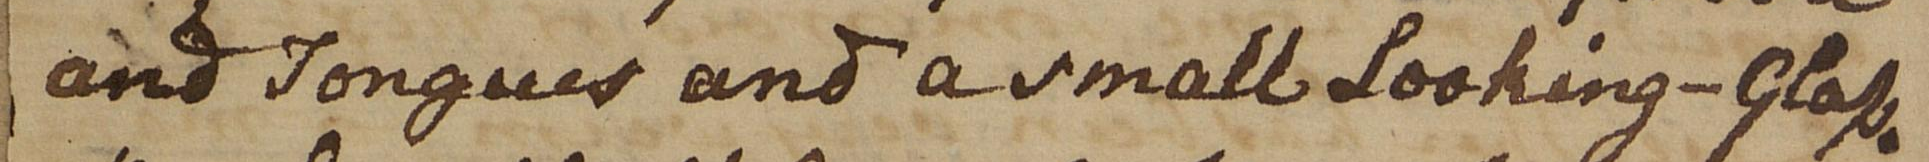and Tongues and a small Looking- Glass.
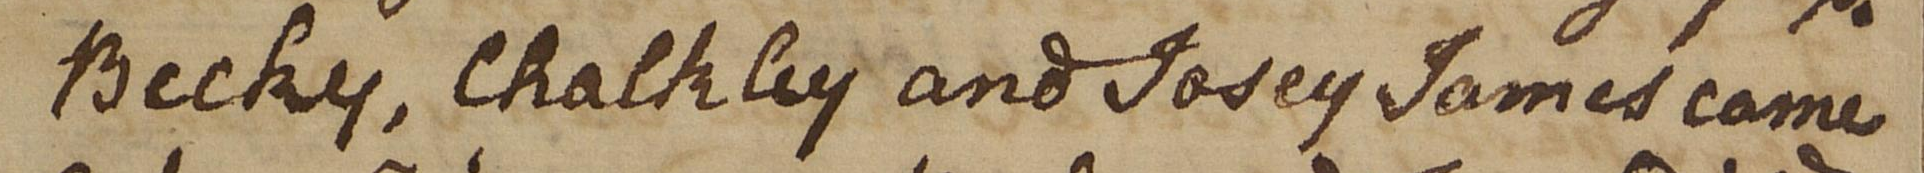Becky, Chalkley and Josey James came
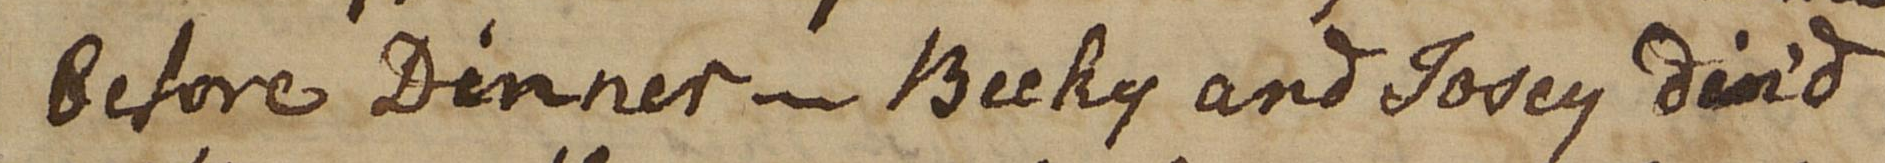before Dinner- Becky and Josey din'd
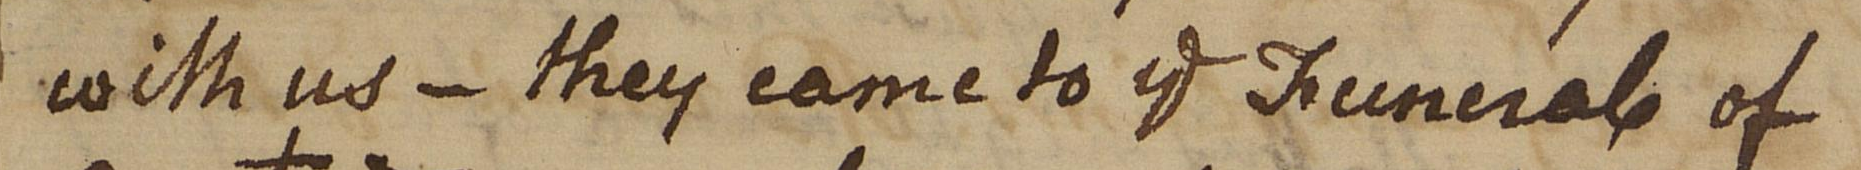with us- they came to y^e Funeral of
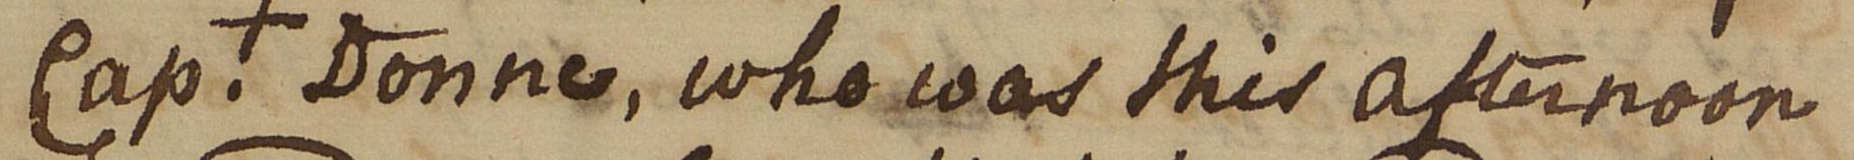Cap^t Donne, who was this afternoon
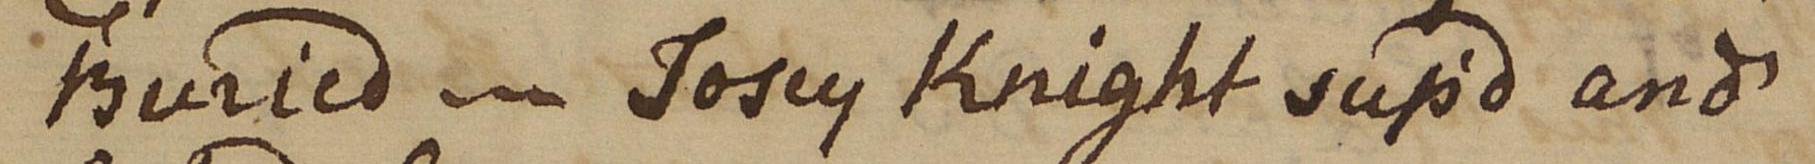Buried- Josey Knight sup'd and
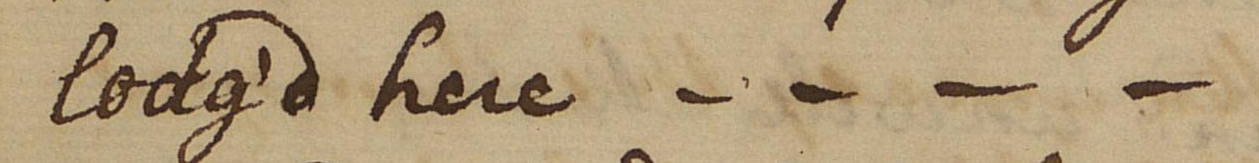lodg'd here----
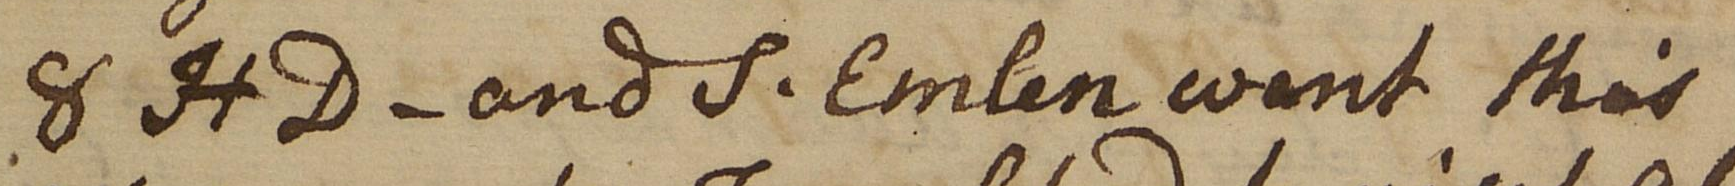8 HD- and S. Emlen want this
